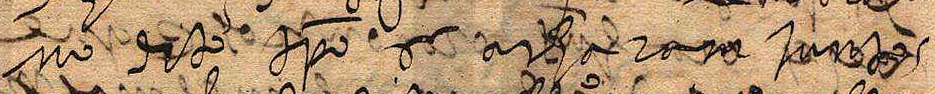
no dito tpō se acharam Juntos
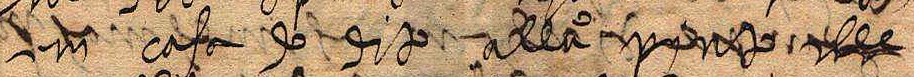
em casa do dito alluo pynto elle
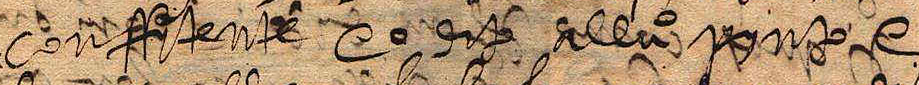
conffytente e o dito alluo pynto e
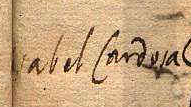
isabel Cardosa
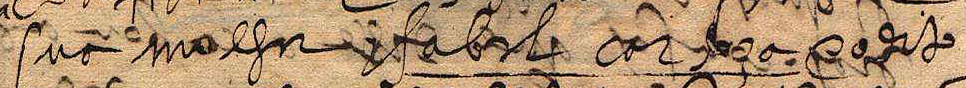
sua molher ysabel cardoza e o dito
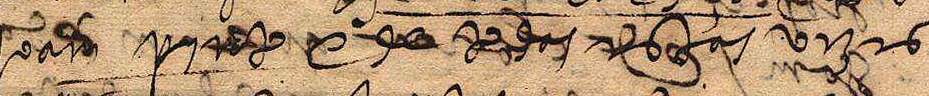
Joam pynto e de todas estas vezes
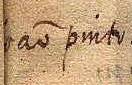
oaõ pinto.
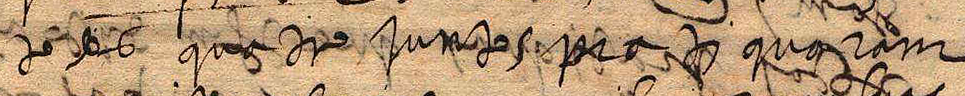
todos quatro Juntos pratjquaram
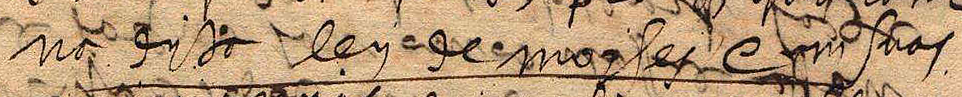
na dyta ley de moyses e em suas
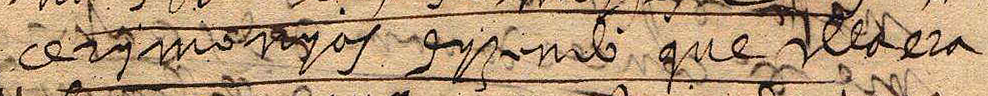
cerymonyas dyzendo que ella era
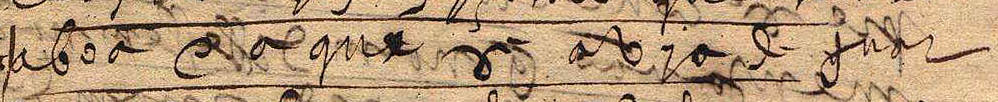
a boa e a que se avya de guar
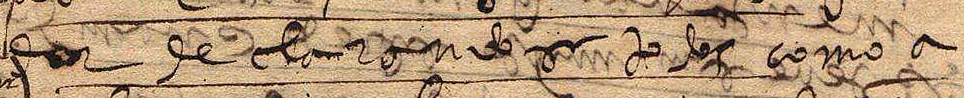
dar declarando se todos como a
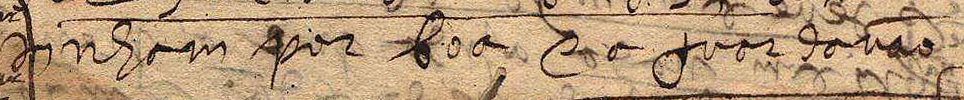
tynham por boa e a guardauão
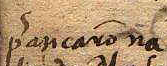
p̄aticarō na
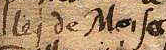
lej de Moises
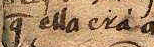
q̄ ella era a
